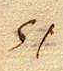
51
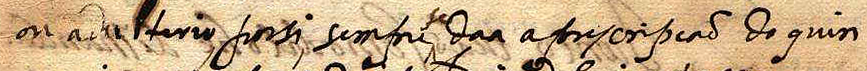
ou adulterio, por si, sempre se daa a prescripçaõ do quin
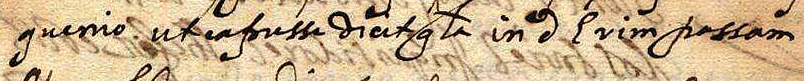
quenio ut capusse dicit gl̄a in d Erim passam
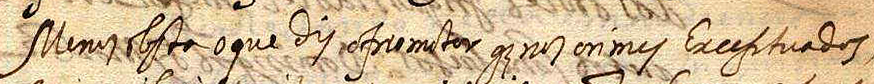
Menos obsta o que dis o promotor qꝫ nos crimes Exceptuados,
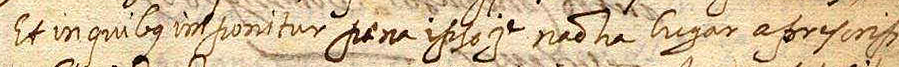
Et in quibꝯ imponitur pæna ipso je naõ ha lugar a prescrip
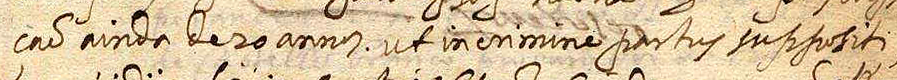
çaõ ainda de 20 annos. ut in crimine partus suppositi,
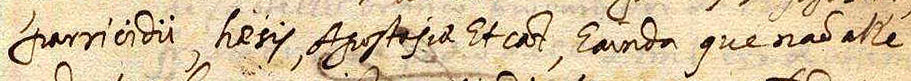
parricidii, hæsis, Apostasiæ Et cast, E ainda que naõ alle
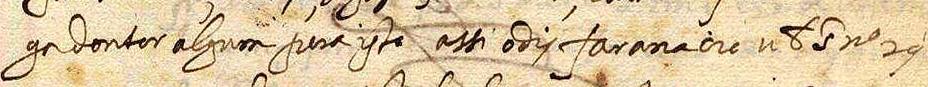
ga doutor algum pera isto assi o dis farana oie ut s̄ no 29
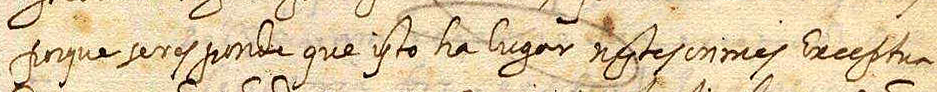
porque se responde que isto ha lugar nestes crimes Exceptua
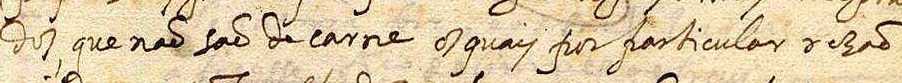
dos que naõ saõ de carne os quais por particular rezaõ
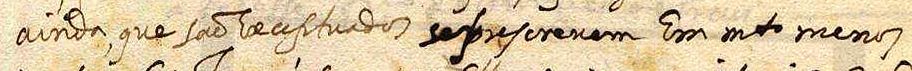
ainda, que saõ de Exceptuados se prescreuem Em mto menos
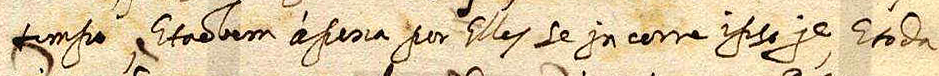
tempo, E taõbem a pena por Elles se jncorre ipso je, E toda
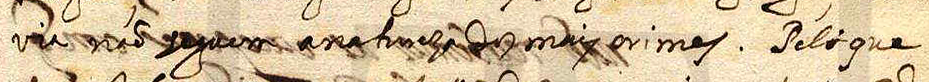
via naõ seguem a natureza dos mais crimes. Pelo que
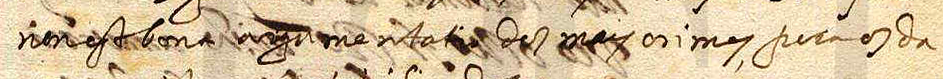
non est bona argumentatio dos mais crimes, pera os da
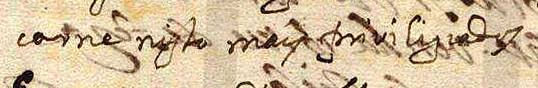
carne nisto mais priviligiados
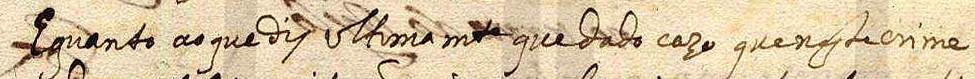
E quanto ao que dis ultimamte que dado cazo que neste crime
